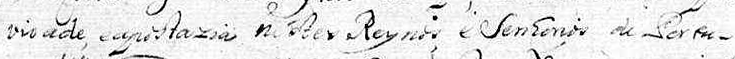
uidade e apostazia nestes Reynos e Senhorios de Portu
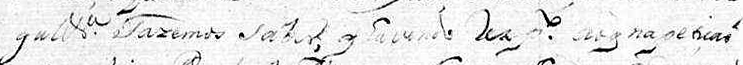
gal &.a Fazemos saber, q̄ hauendo resp.o ao q̄ na petiçaõ
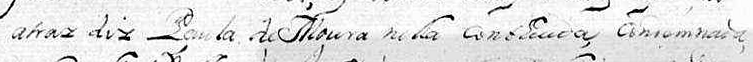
atraz diz Paula de Moura nella contheuda, condemnada,
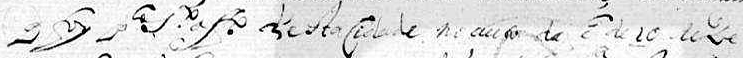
q̄ foy plo s.to off.o desta Cidade no auto da fe de 10 de De
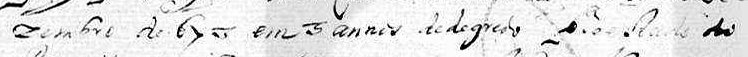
zembro de 673 em 3 annos de degredo p.a o estado do
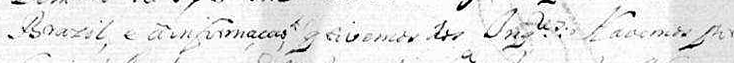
Brazil, e a informaçaõ q̄ tivemos dos Inq.res Havemos por
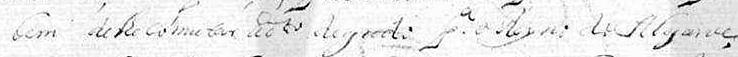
bem de lhe comutar ho dto degredo p.a o Reyno do Algarue
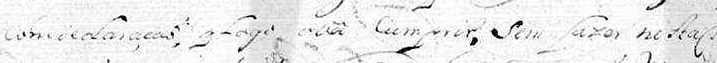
consideraçaõ q̄ logo o ia Cumprir, sem fazer nesta Ci
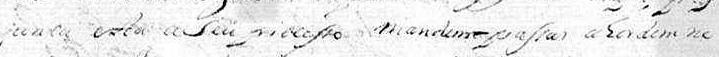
junte esta a seu processo mandem passar a hordem ne
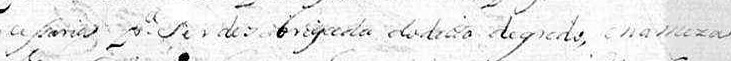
cessaria p.a ser desobrigada do ditta degredo, na meza
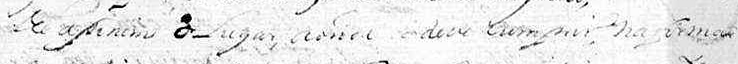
lhe assinem o Lugar, ainda deve cumprir na forma
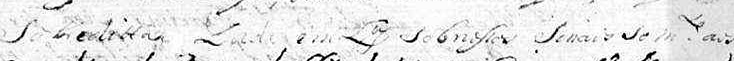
sobreditta Dada em Lxa sob nossos sinais somte aos
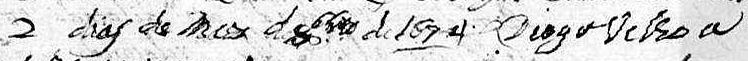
2 dias de mez de 8.bro de 1674 Diogo Velho a
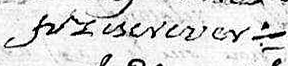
fiz escrever
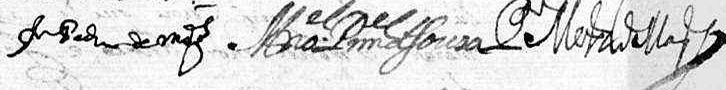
fr Pedro de mages Mnoel Pimel d̄ sousa Po Mexa de Mages
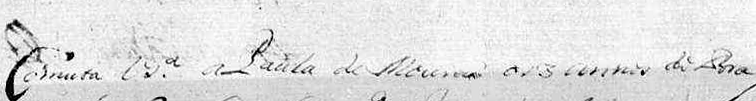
Comuta V S.a a Paula de Moura aos annos do Bra
